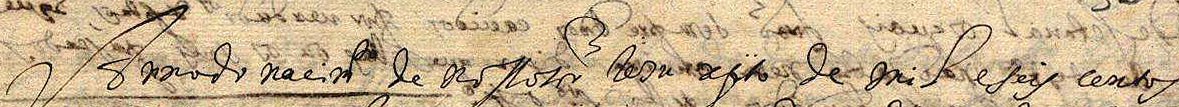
Anno do nacimto de nosso srō Iesu xpto de mil e seiscentos
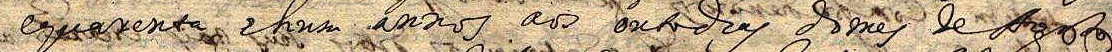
e quarenta e hum annos aos outo dias do mes de Agosto
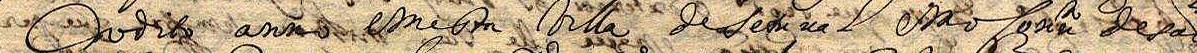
do dito anno em esta Villa de setuual em o Conuto de são
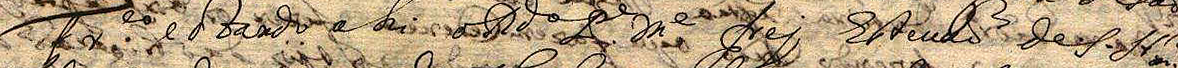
Fr.co estando ahi o Rdo Pe Me frej Esteuaõ de S. H.
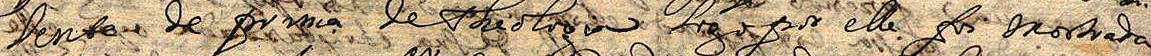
lente de prima de Theologia logo por elle foi mostrada
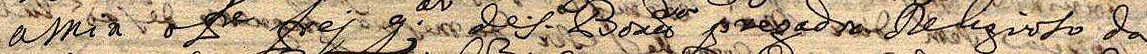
a min o p.e frej g.ar de s. Boaura pregador Religioso da
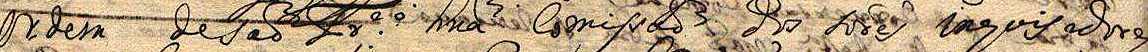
Ordem de saõ Fr.co huā Comissaõ dos sorēs inquisidores
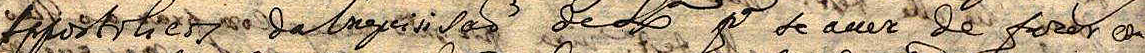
Appostolicos da Inquisisaõ de Lxa pa se auer de fazer em
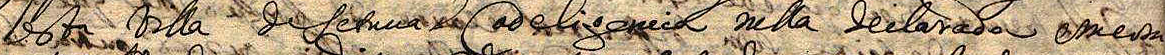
esta Villa de Setuual a deligencia nella declarada em com
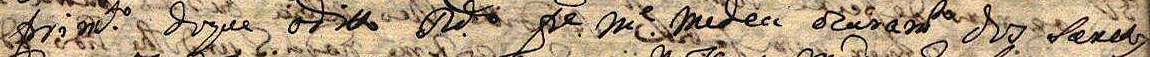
prim.to do que o ditto R.do pe. me. me deu o iuramto dos sanctos
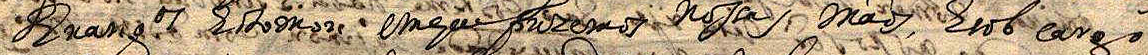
Euang.os E o tomou em que puzemos nossas mãos, E sob cargo
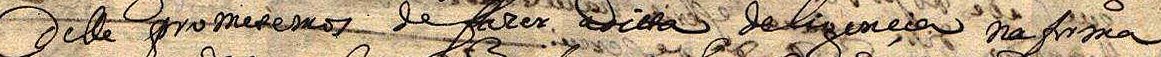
delle prometemos de fazer a ditta deligençia na forma
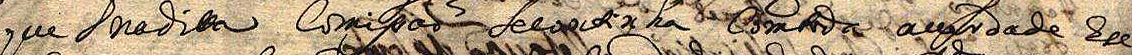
que na ditta Comissão se continha com toda a uerdade E se
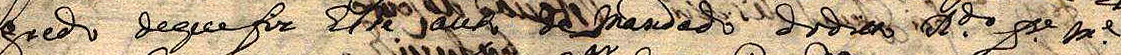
gredo de que fiz Este auto de mandado do ditto R.do p.e m.e
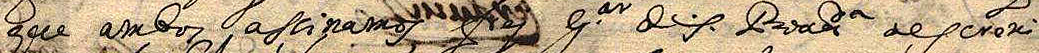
que ambos assinamos frej G.ar de s. Boaura o escreui.
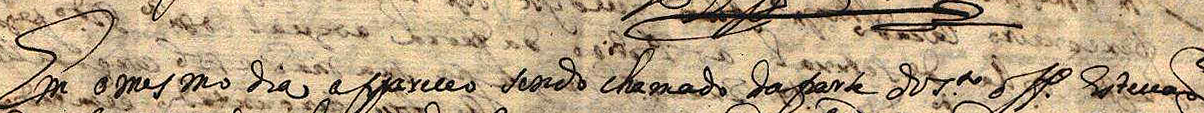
Em o mesmo dia appareceo sendo chamado da parte do s.to off.o Esteuaõ
